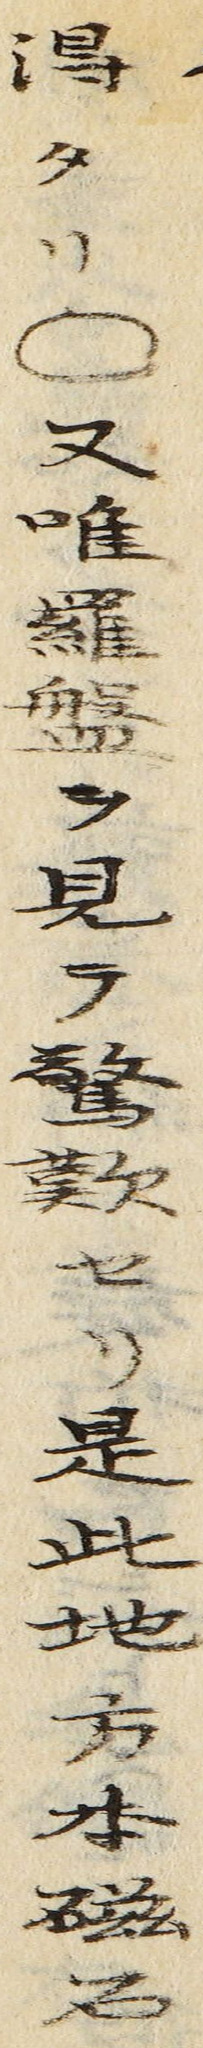得タリ◯又唯羅盤ヲ見テ驚歎セリ是此地方本磁石
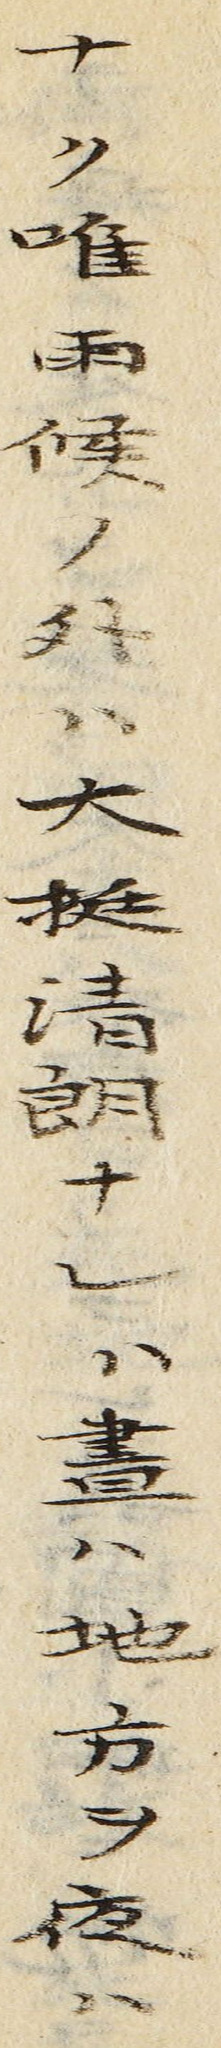ナク唯雨候ノ外ハ大梃清朗ナレハ昼ハ地方ヲ夜ハ
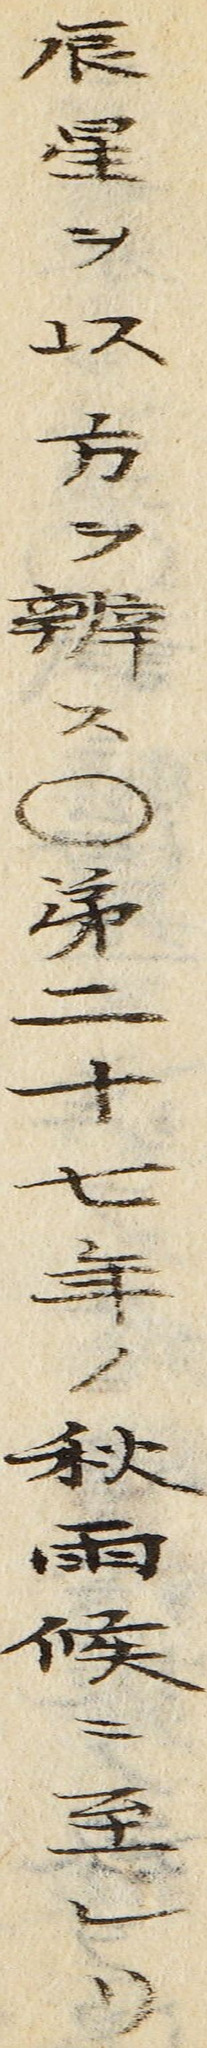辰星ヲ以方ヲ弁ス◯第二十七年ノ秋雨候ニ至レリ
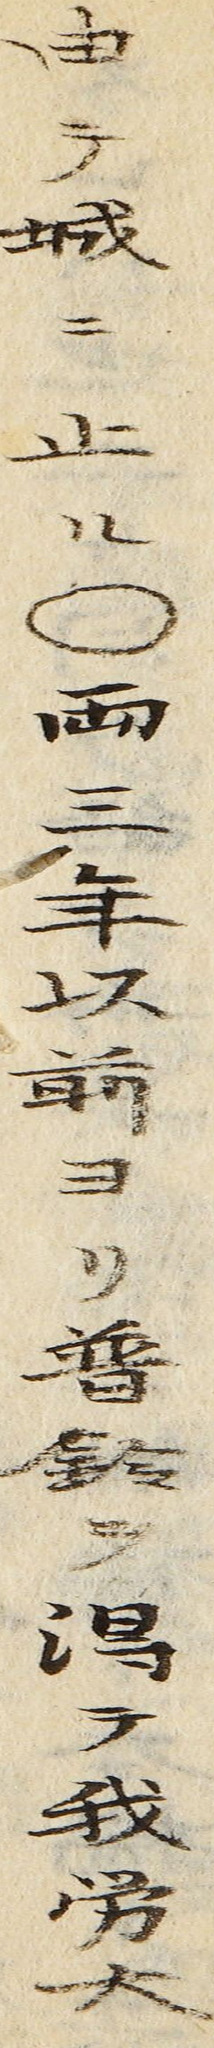由テ城ニ止ル◯両三年以前ヨリ普鈴ヲ得テ我労大
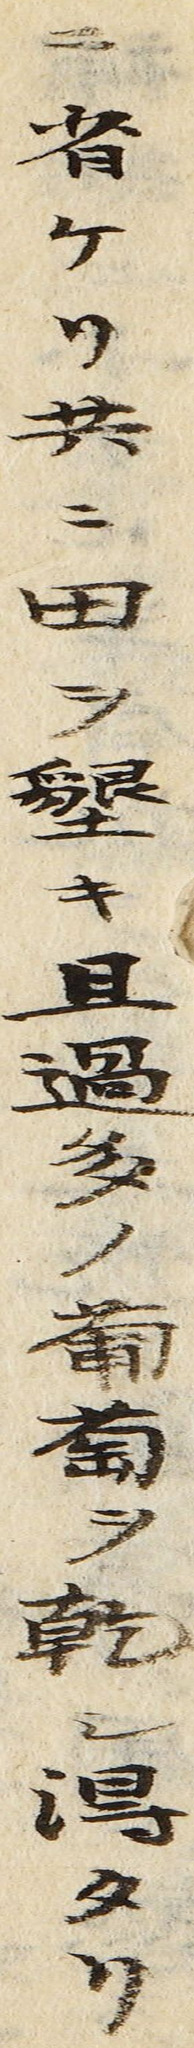ニ省ケリ共ニ田ヲ墾キ且過多ノ葡萄ヲ乾シ得タリ
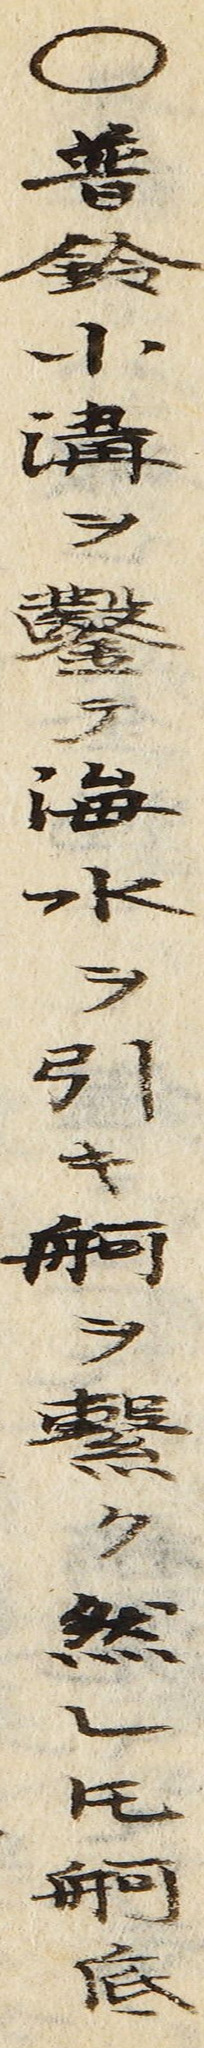◯普鈴小溝ヲ鑿テ海水ヲ引キ舸ヲ繋ク然レトモ舸底
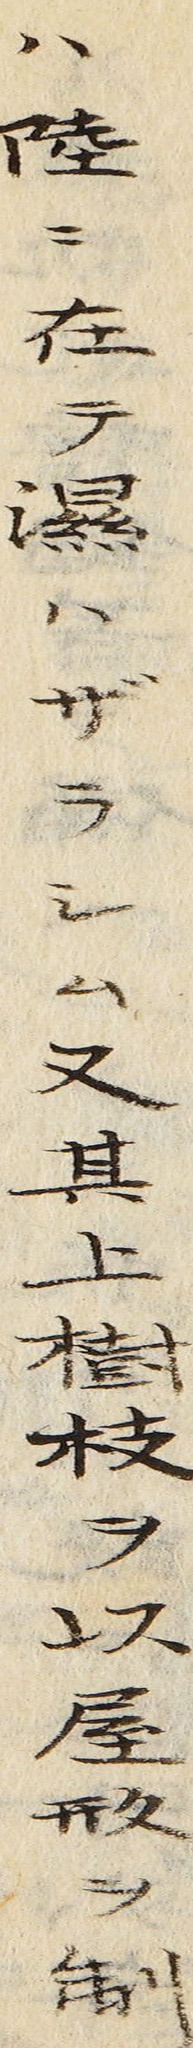ハ陸ニ在テ湿ハザラシム又其上樹枝ヲ以屋形ヲ制
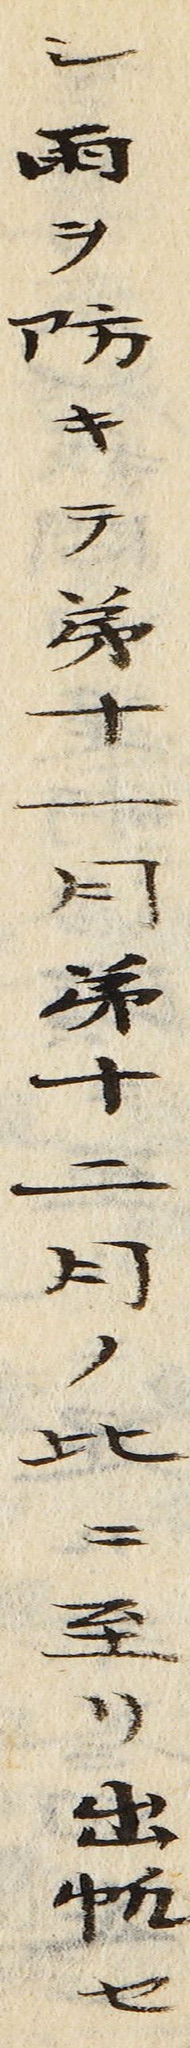シ雨ヲ防キテ第十一月第十二月ノ比ニ至リ出航セ
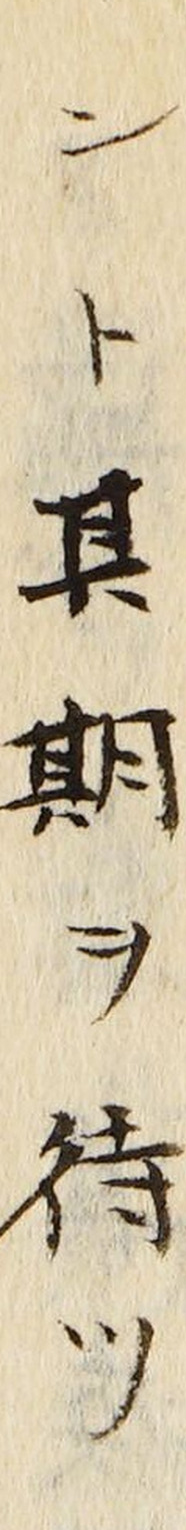ント其期ヲ待ツ
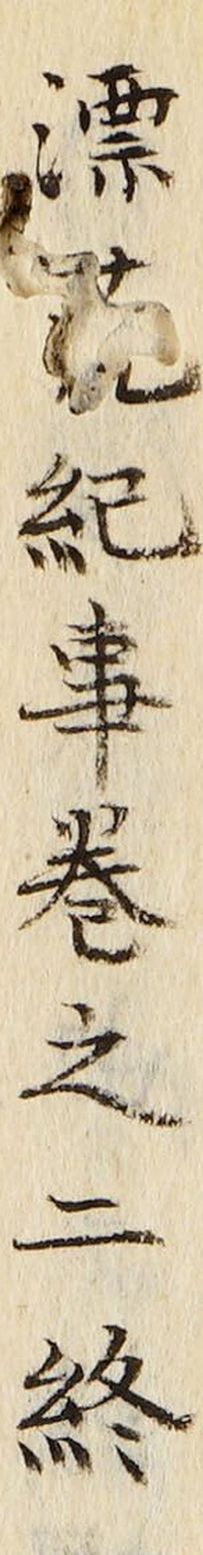漂荒紀事巻之二終

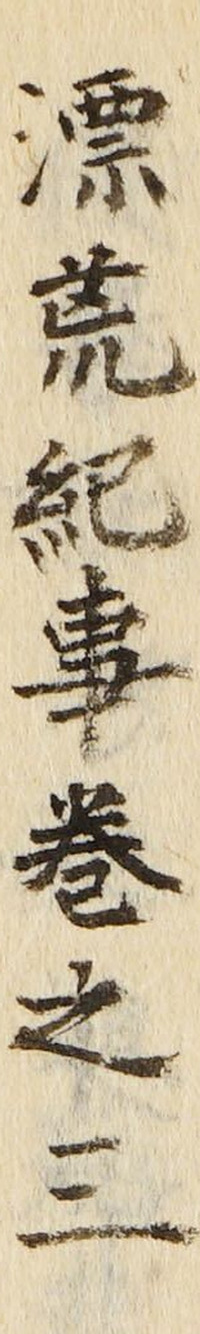漂荒紀事巻之三
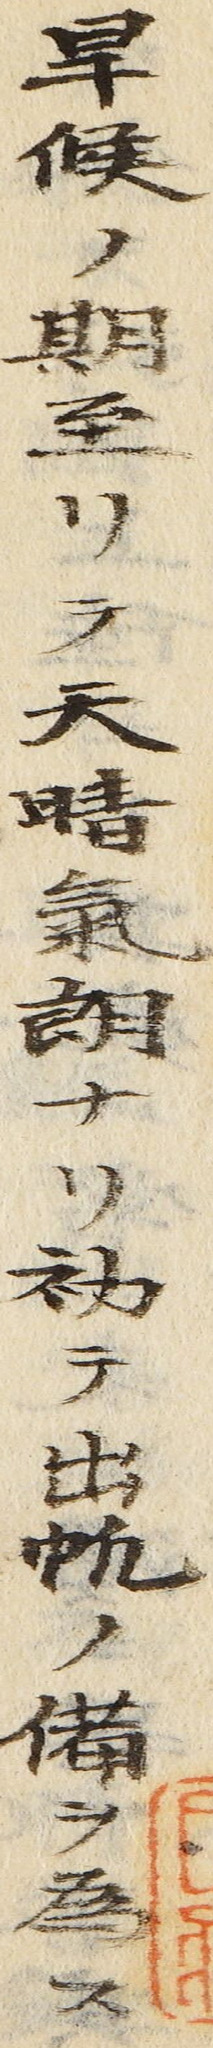旱候ノ期至リテ天晴気朗ナリ初テ出帆ノ備ヲ為ス
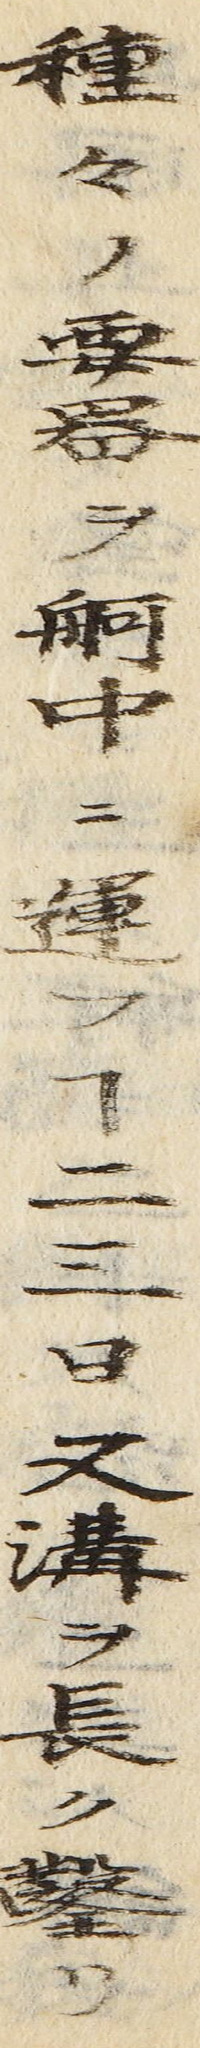種々ノ要器ヲ舸中ニ運フコト二三日又溝ヲ長ク鑿リ
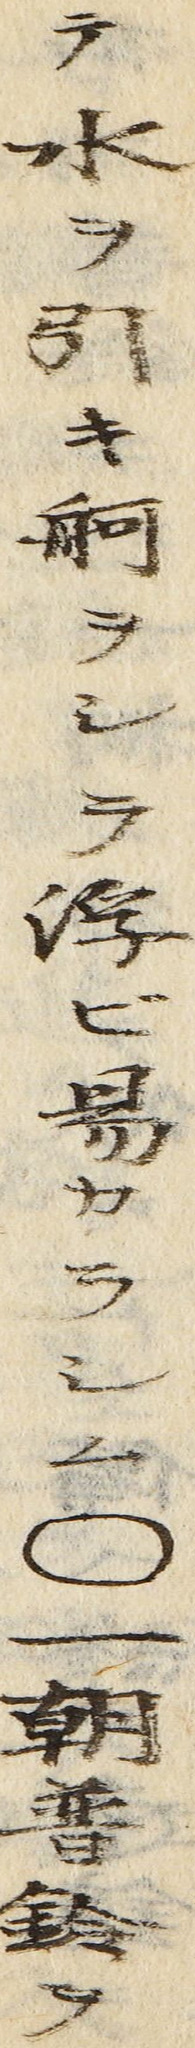テ水ヲ引キ舸ヲシテ浮ビ易カラシム◯一朝普鈴ヲ
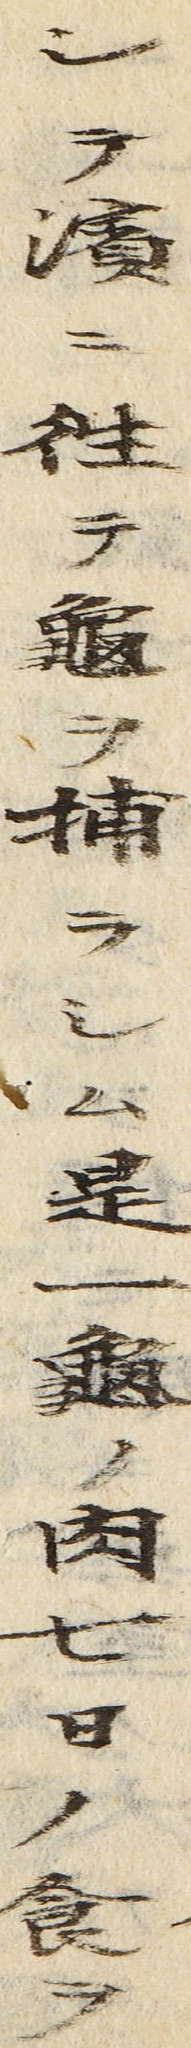シテ浜ニ往テ亀ヲ捕ラシム是一亀ノ肉七日ノ食ヲ
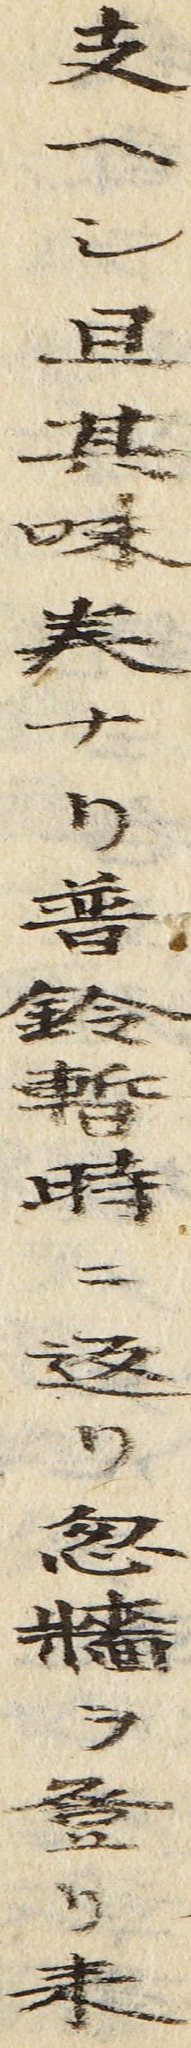支ヘシ且其味美ナリ普鈴暫時ニ返リ忽牆ヲ登リ来
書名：漂流紀事
